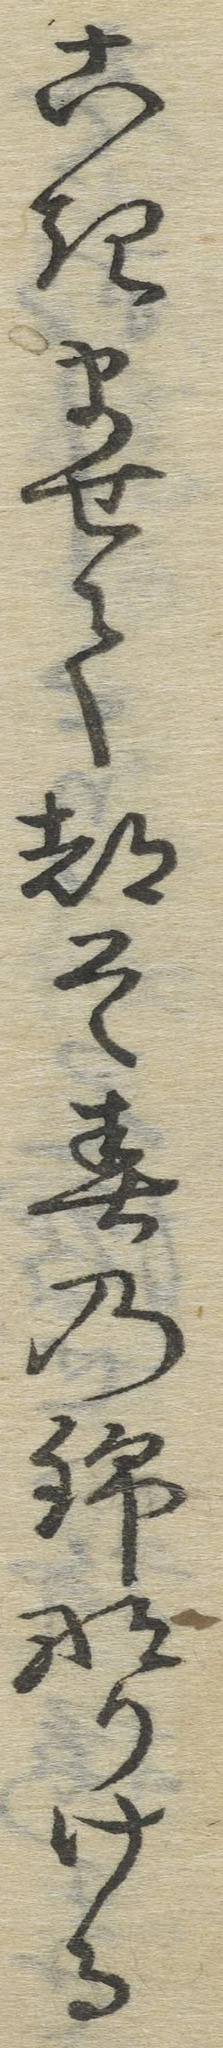こきませて都そ春の錦なりける
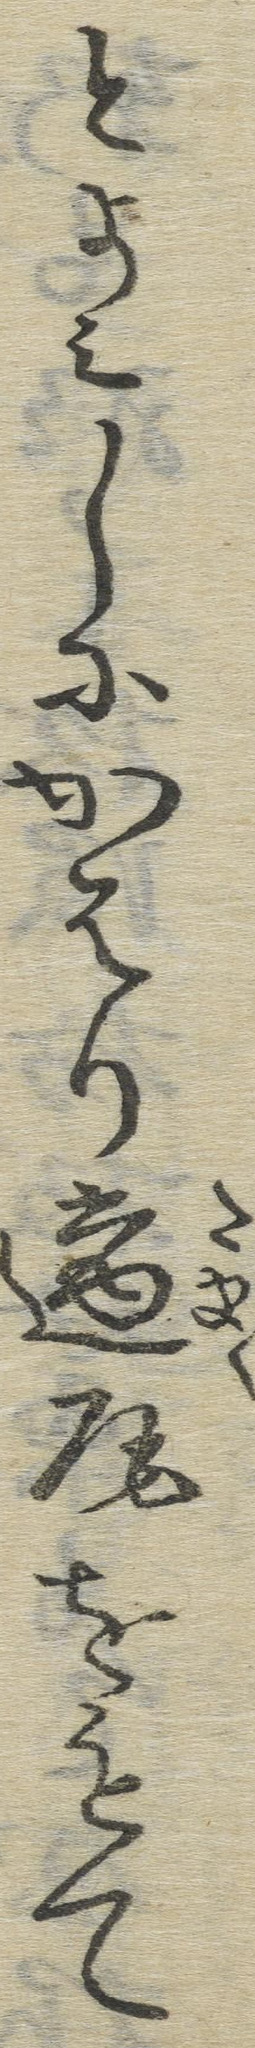とよみしにかはり遇瓦をもて
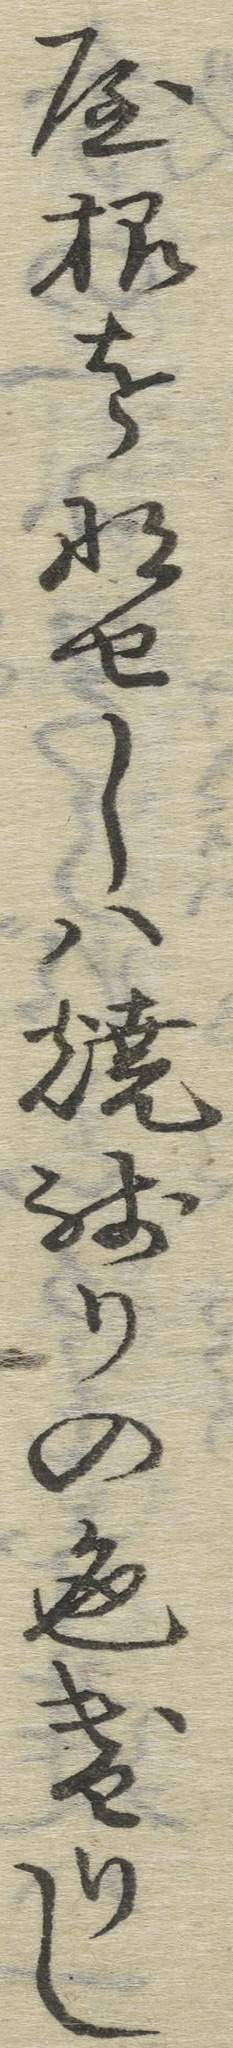屋根をなせしは焼残りの色香りし
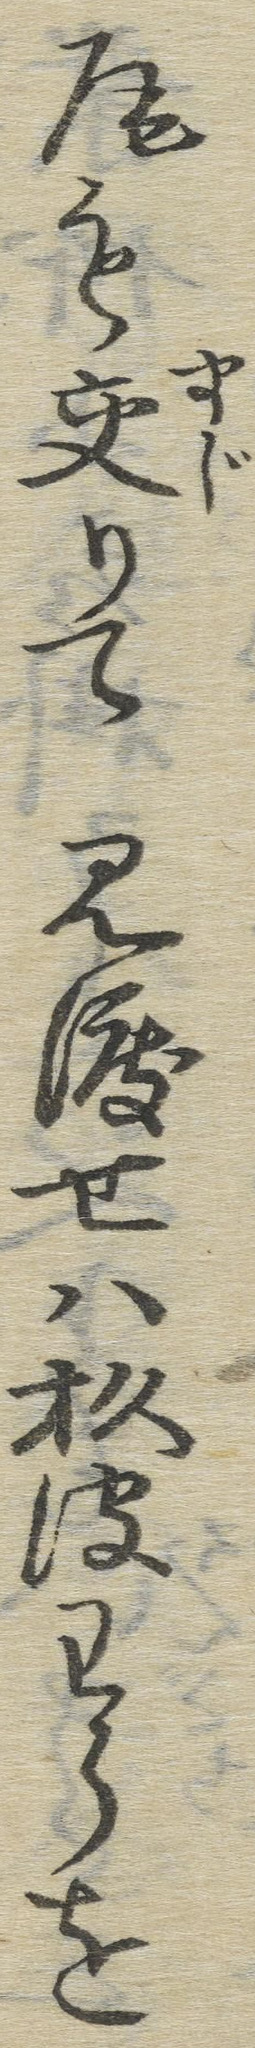瓦も交りて見渡せは杦皮わらを
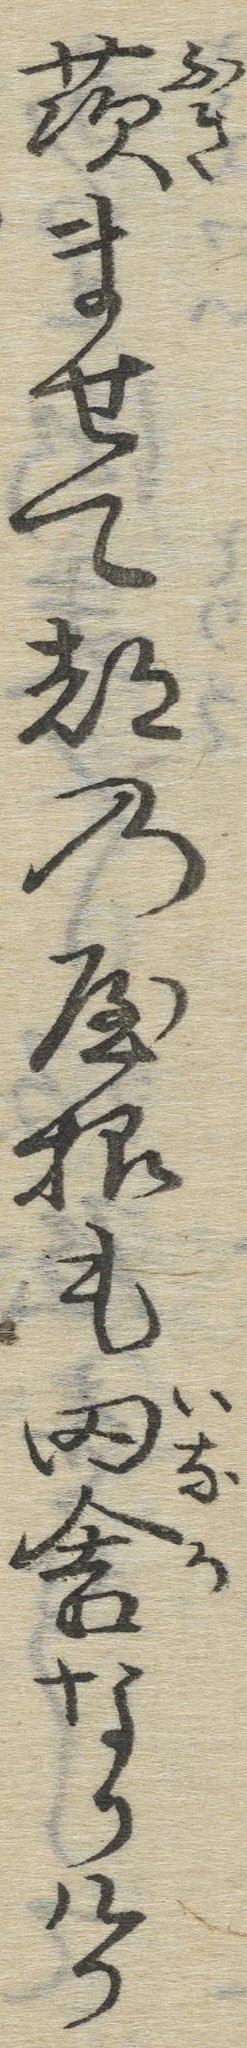茨ませて都の屋根も田舎なりけり
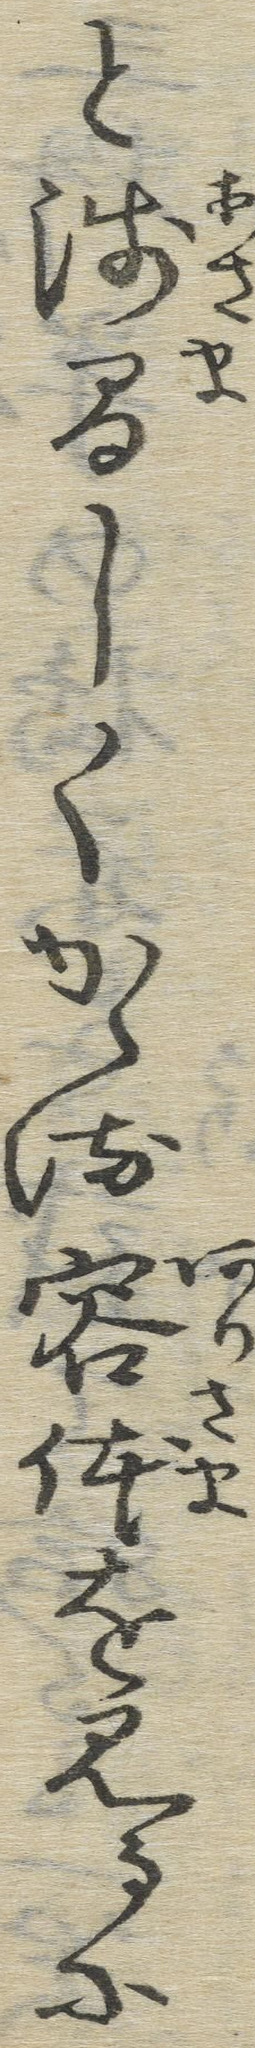と浅間しくかかる容体を見るに
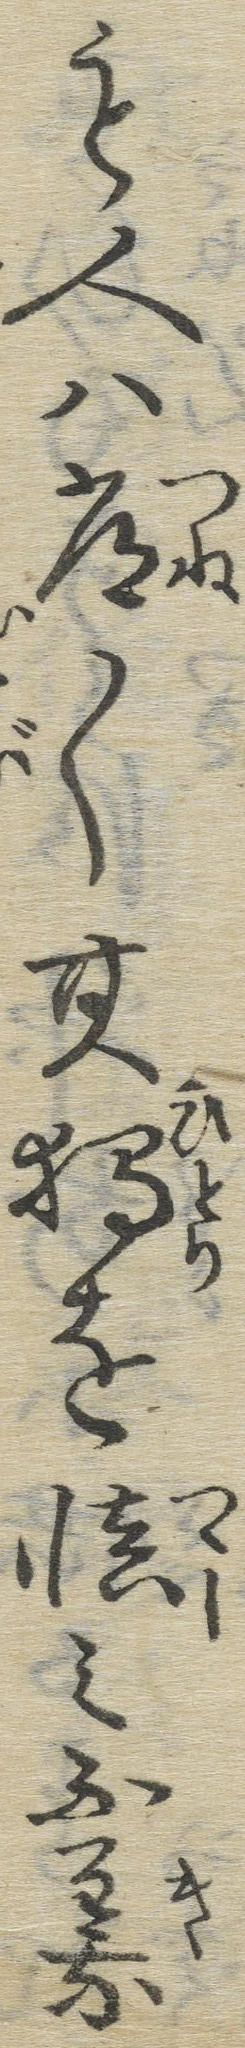も人は常〳〵其獨を慎み不義
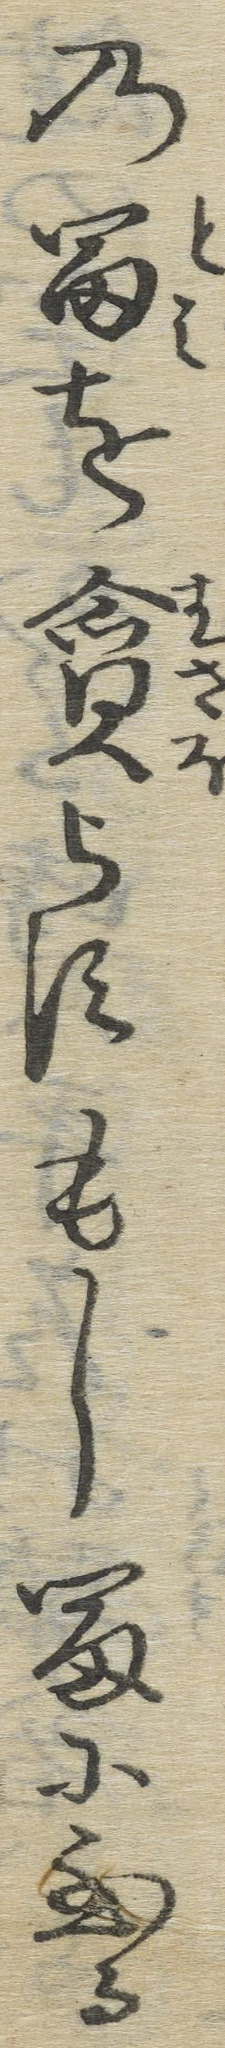の冨を貪らずもし冨に至る
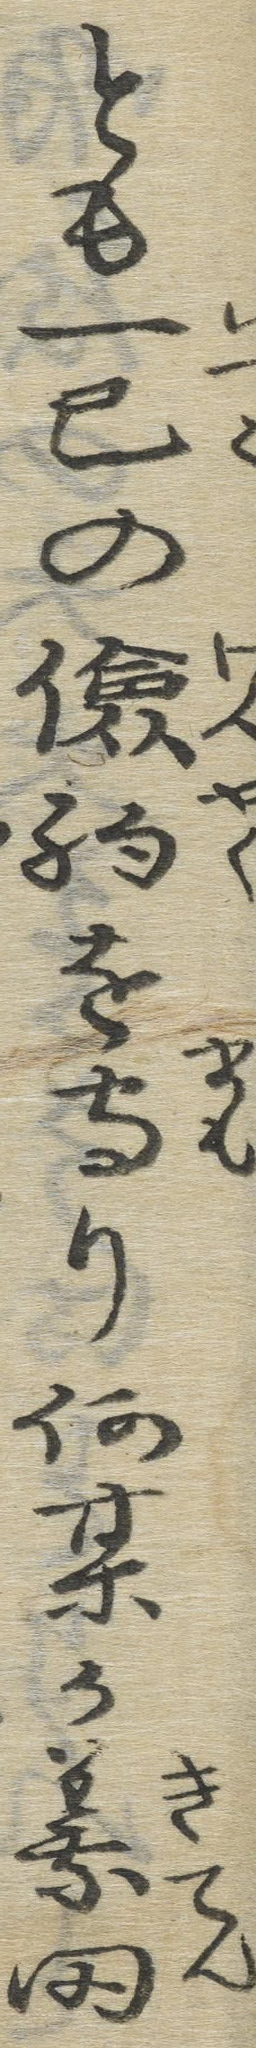とも一己の儉約を守り何某か義田
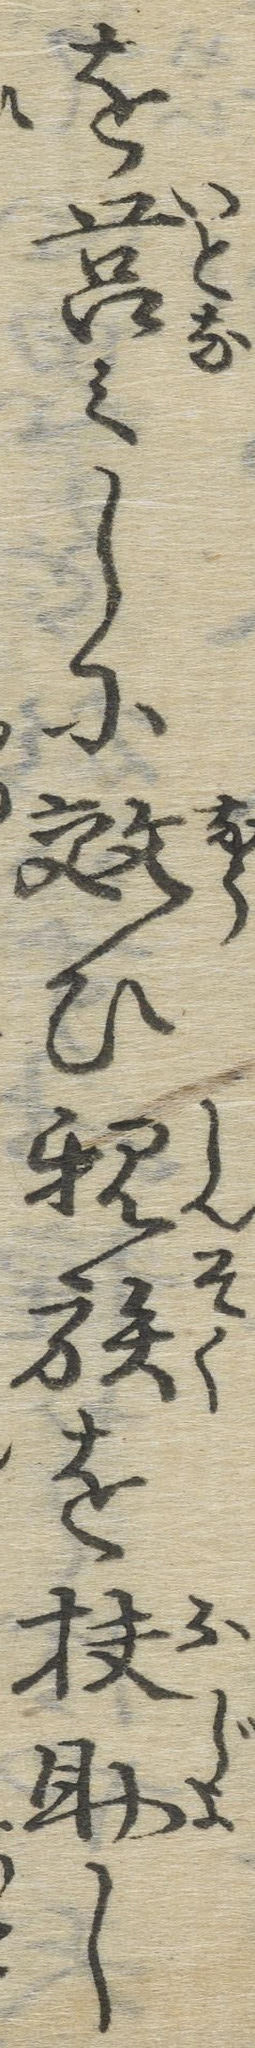を営みしに效ひ親族を扶助し
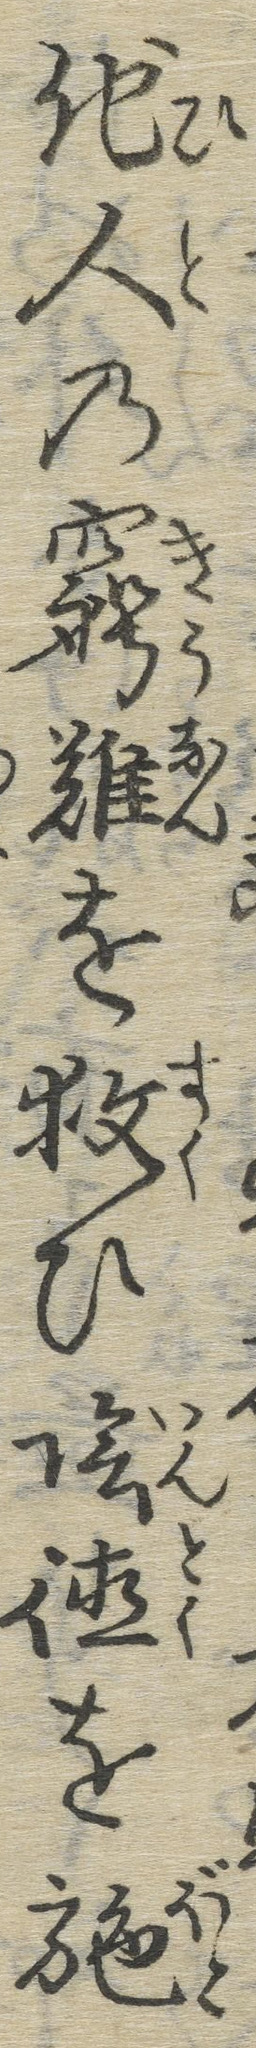他人の窮難を救ひ陰徳を施
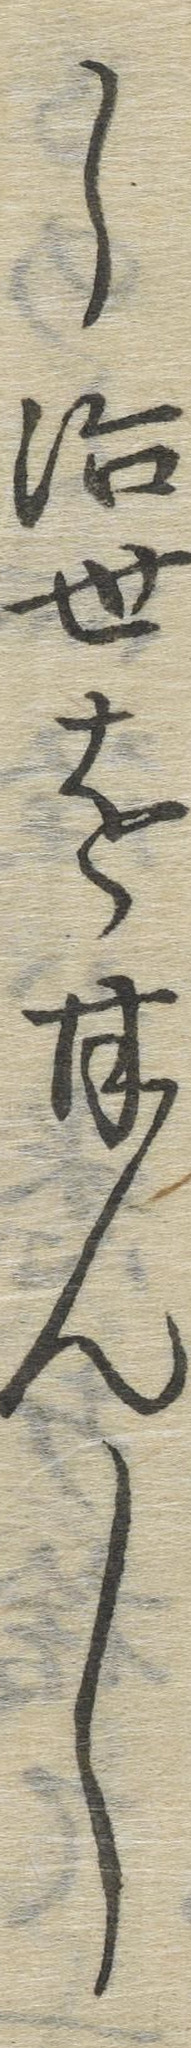し治世を甘んし
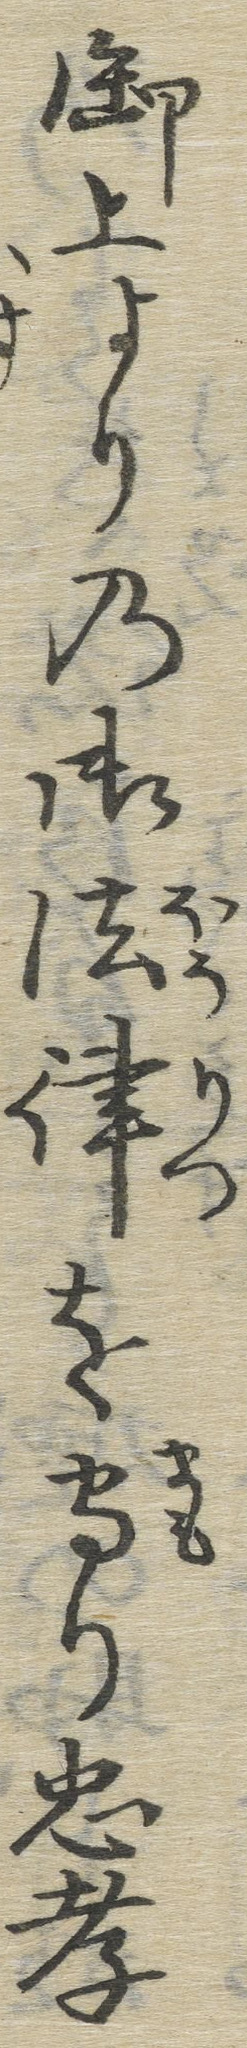御上よりの御法律を守り忠孝
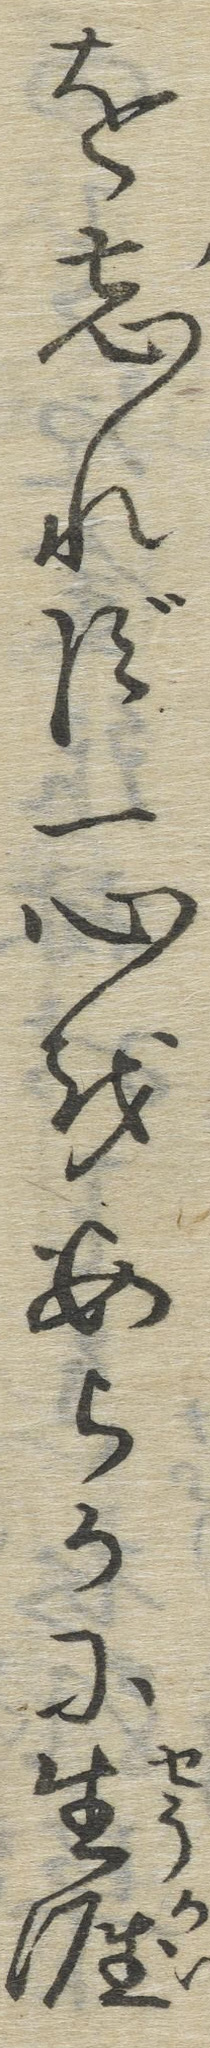を忘れず一心をあらうに生涯
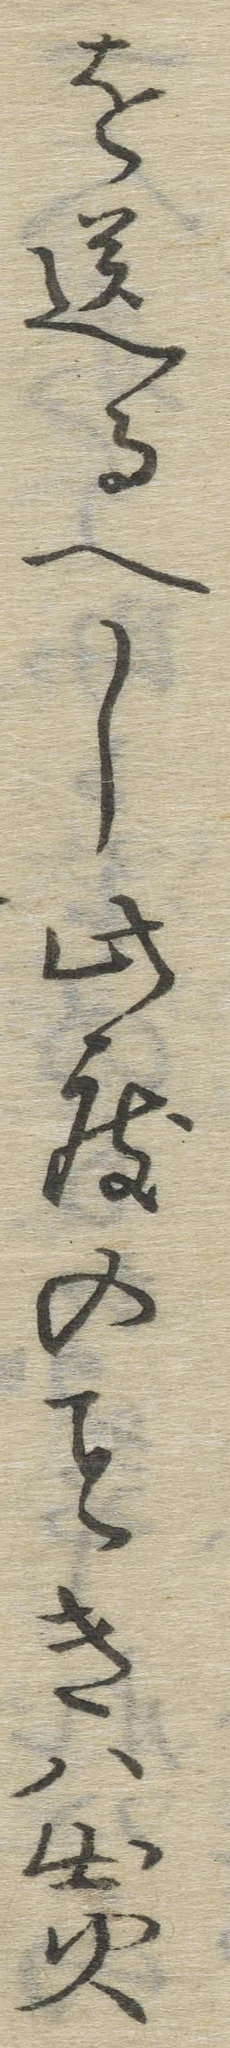を送るへし此度のこときは出火
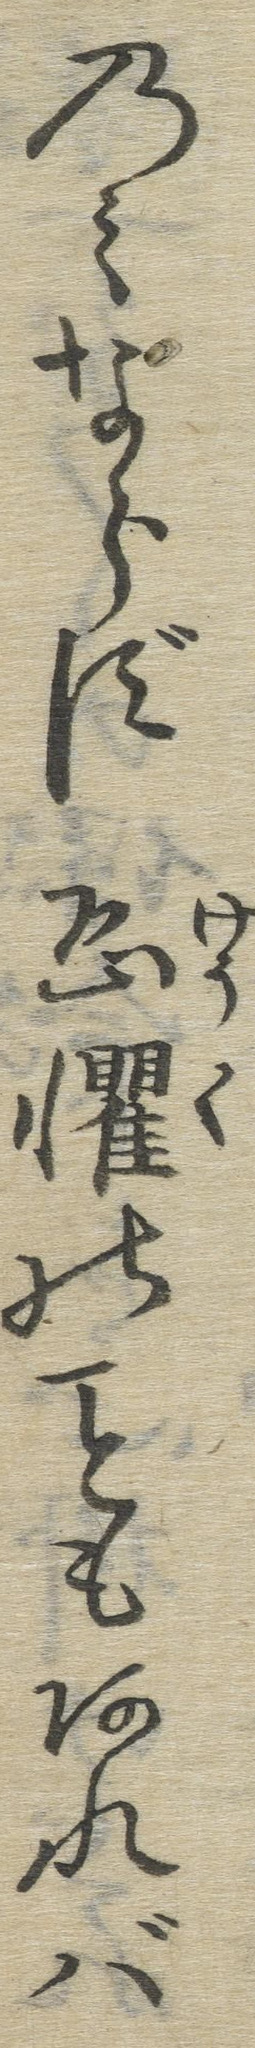のみならず恐懼のこともあれば
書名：あきの日照
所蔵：東京大学地震研究所図書室 Earthquake Research Institute Library, The University of Tokyo, JAPAN
